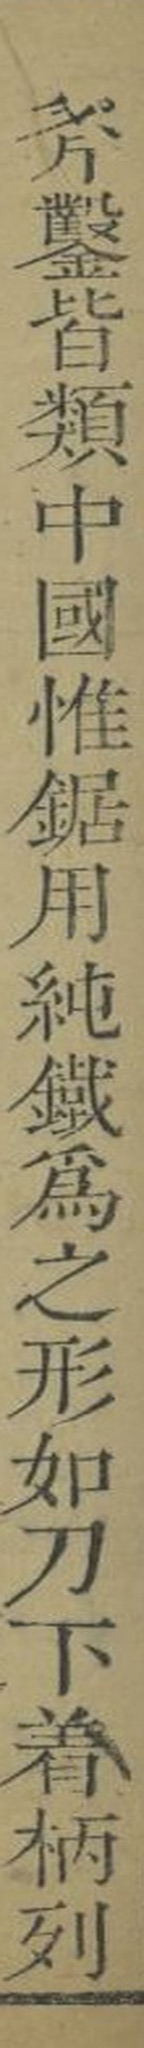斧鑿皆類中国惟鋸用純鉄為之形如刀下着柄列

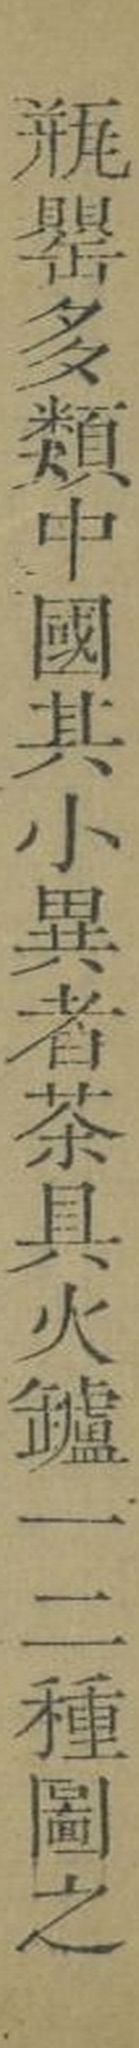瓶罌多類中国其小異者茶具火罏一二種図之
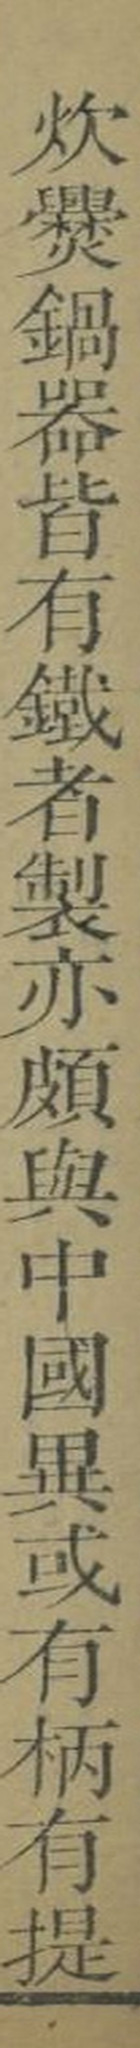炊爨鍋器皆有鉄者製亦頗与中国異或有柄有提
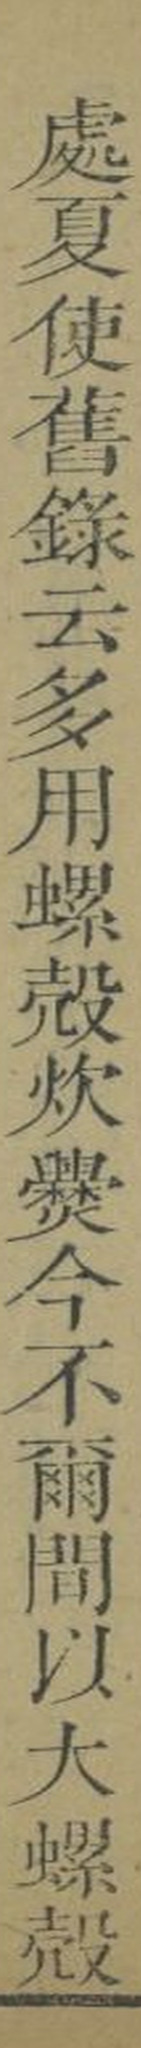処夏使旧録云多用螺殻炊爨今不爾間以大螺殻
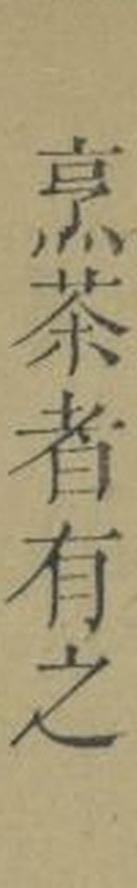烹茶者有之

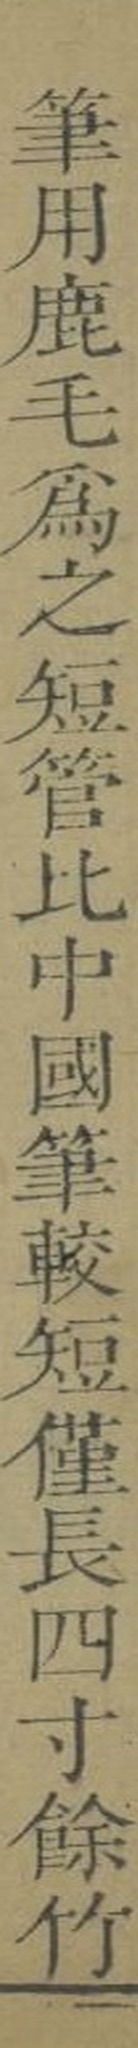筆用鹿毛為之短管比中国筆較短僅長四寸余竹
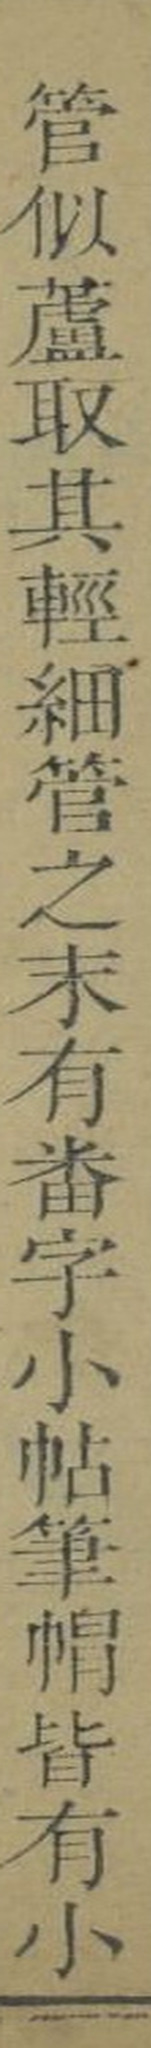管似蘆取其軽細管之末有番字小帖筆帽皆有小
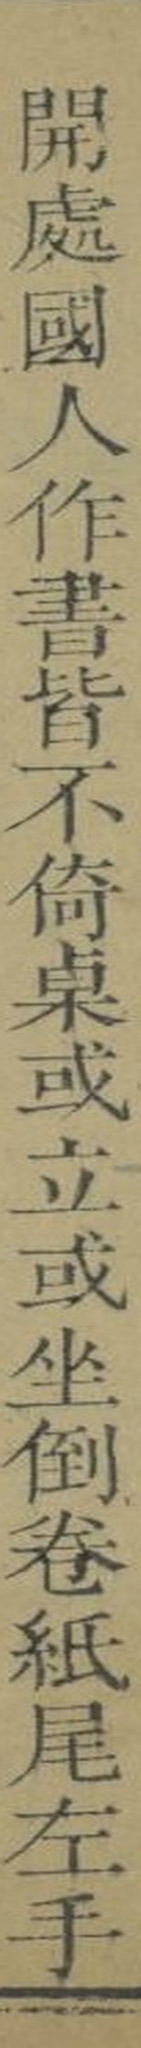開処国人作書皆不倚桌或立或坐倒巻紙尾左手
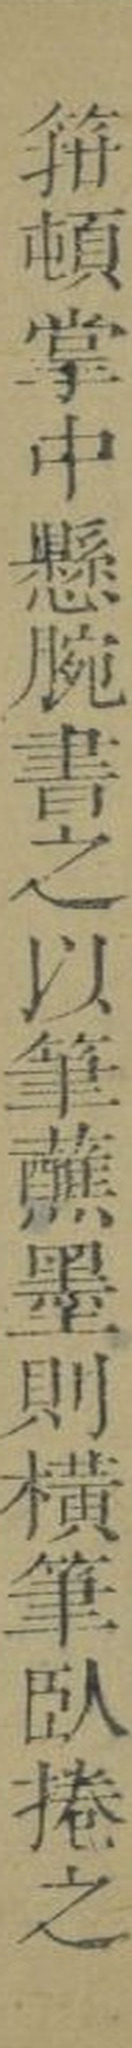箝頓掌中懸腕書之以筆蘸墨則横筆臥捲之
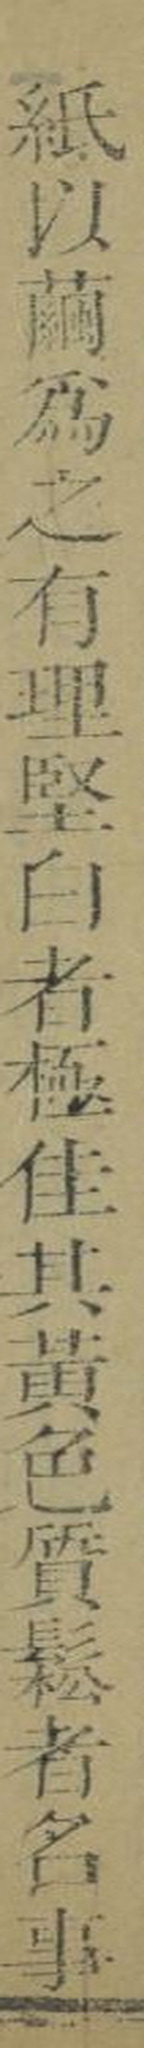紙以繭為之有理堅白者極佳其黄色質鬆者名事
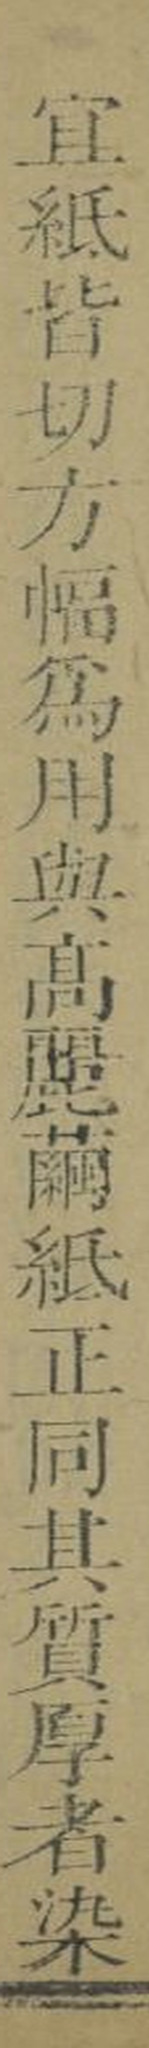宜紙皆切方幅為用与高麗繭紙正同其質厚者染
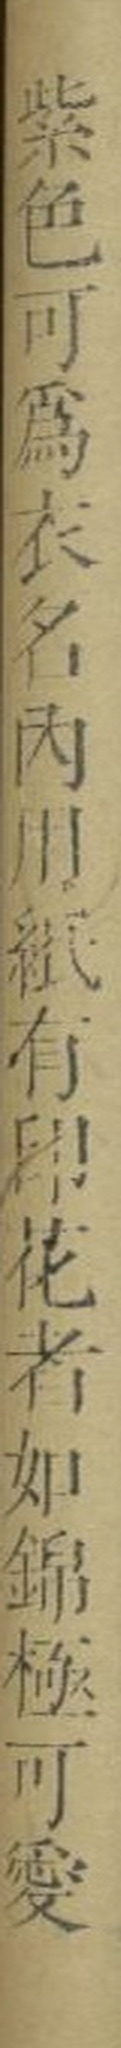紫色可為衣名内用紙有印花者如錦極可愛
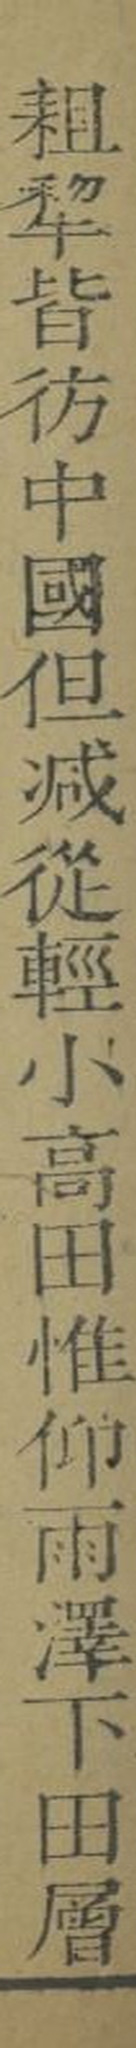耝犂皆彷中国但減従軽小高田惟仰雨沢下田層
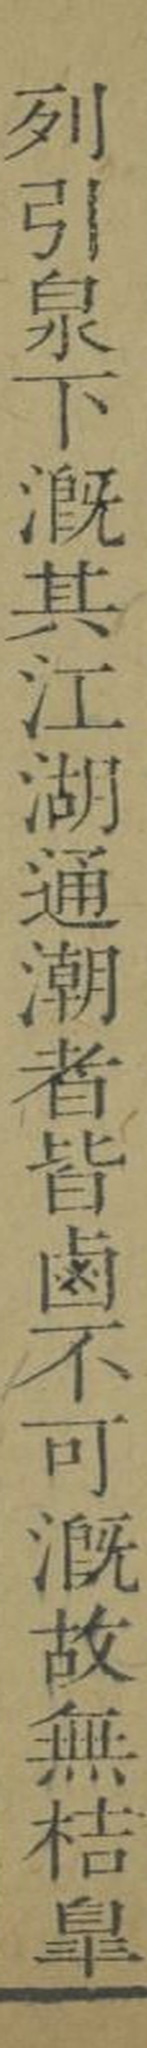列引泉下漑其江湖通潮者皆鹵不可漑故無桔皐
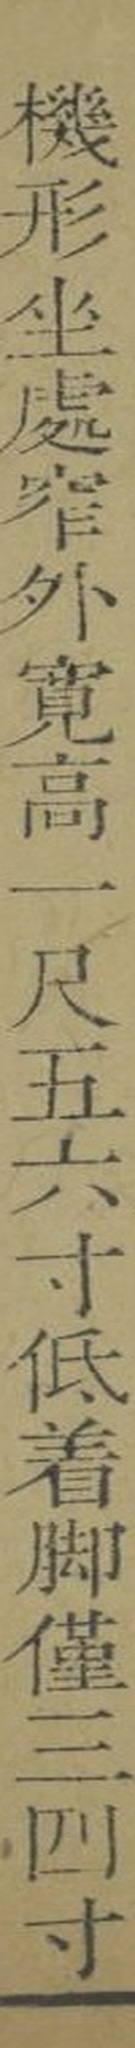機形坐処窄外寛高一尺五六寸低着脚僅三四寸
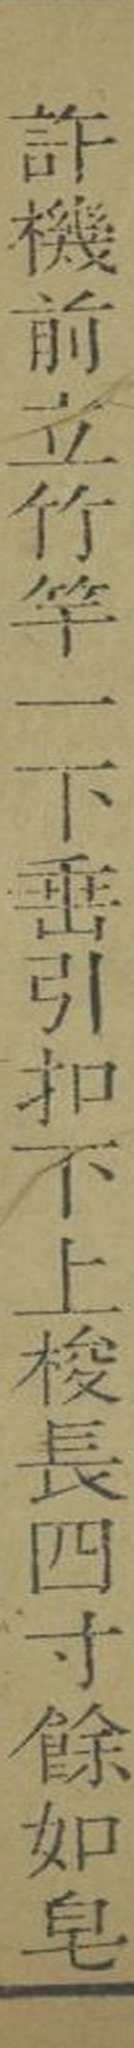許機前立竹竿一下垂引扣下上梭長四寸余如皂
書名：中山伝信録 巻六
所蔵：University of the Ryukyus Library
